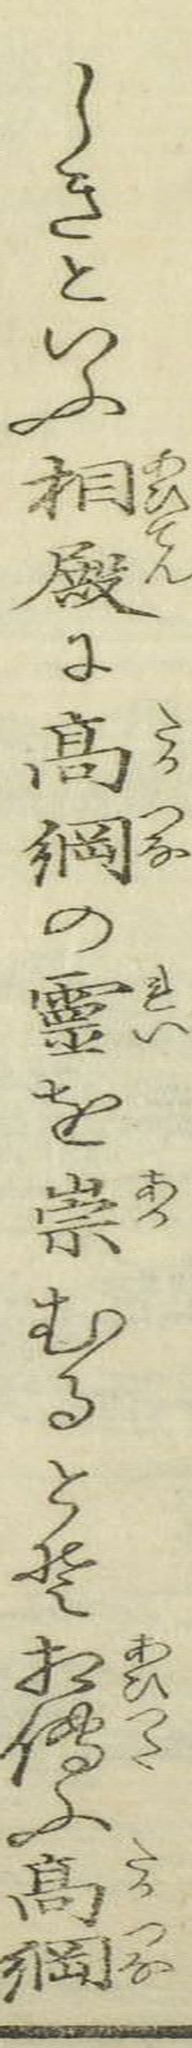しきといふ相殿に高綱の霊を崇むるとそ相傳ふ高綱
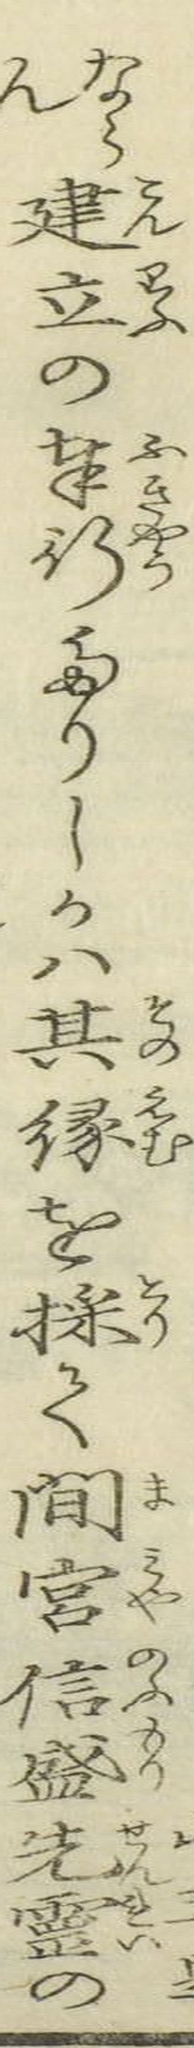ならん建立の奉行たりしかは其縁を採て間宮信盛先霊の
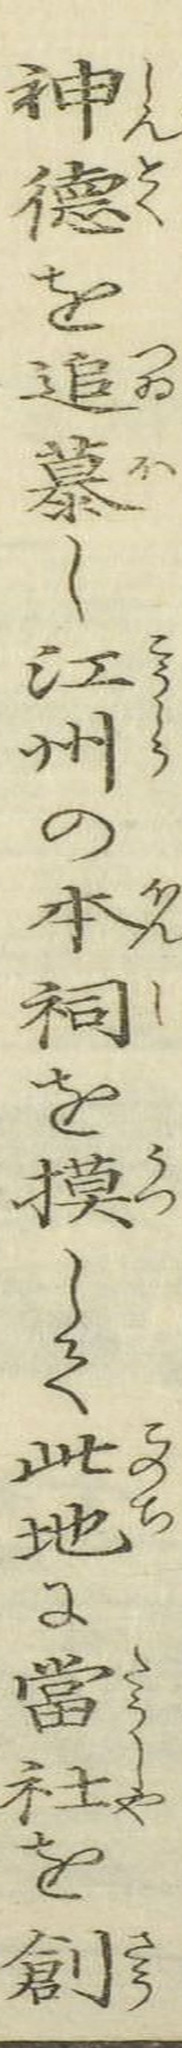神徳を追慕し江州の本祠を摸して此地に當社を創
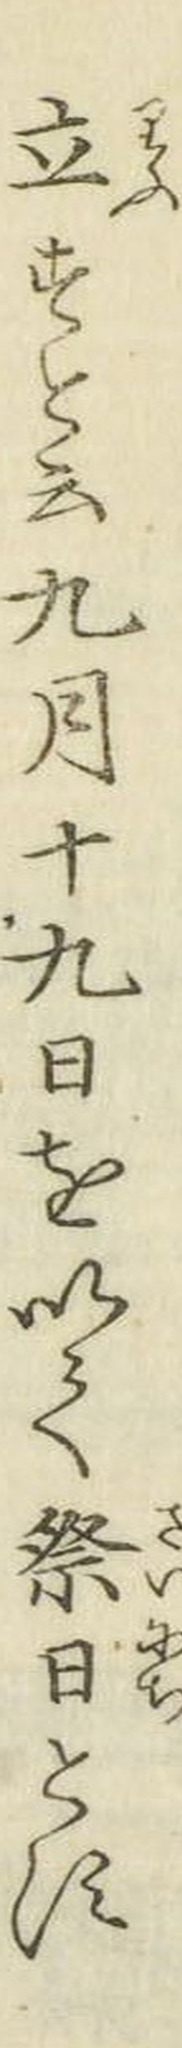立すと云九月十九日を以て祭日とす
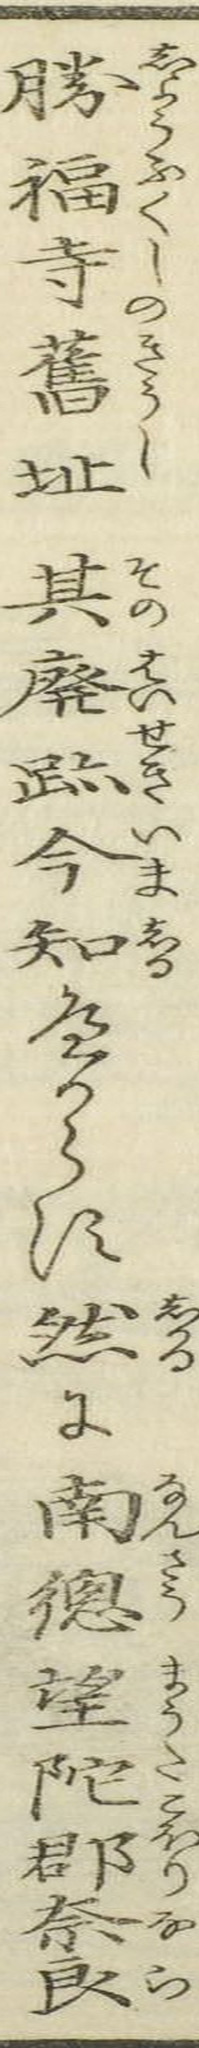勝福寺舊址其廃跡今知へからす然に南総望陀郡奈良
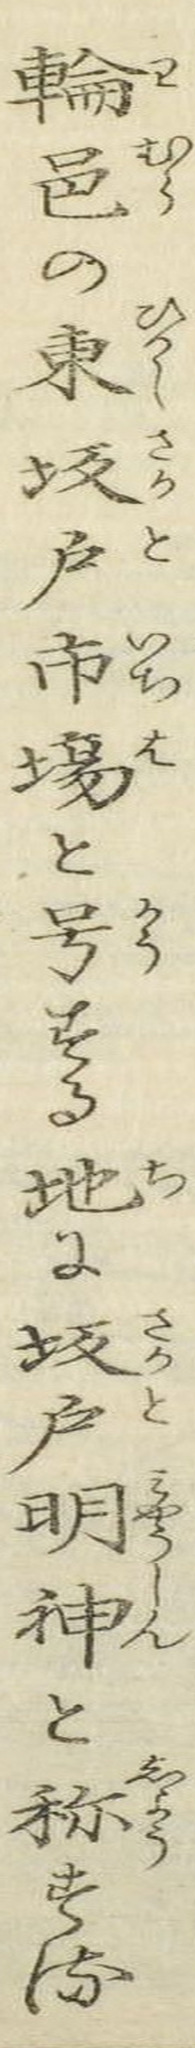輪邑の東坂戸市場と号する地に坂戸明神と称する
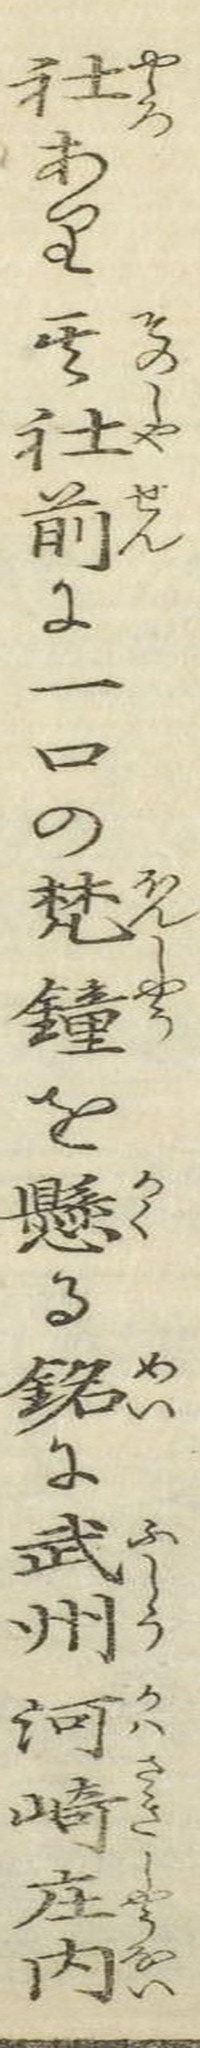社あり其社前に一口の梵鐘を懸る銘に武州河崎庄内
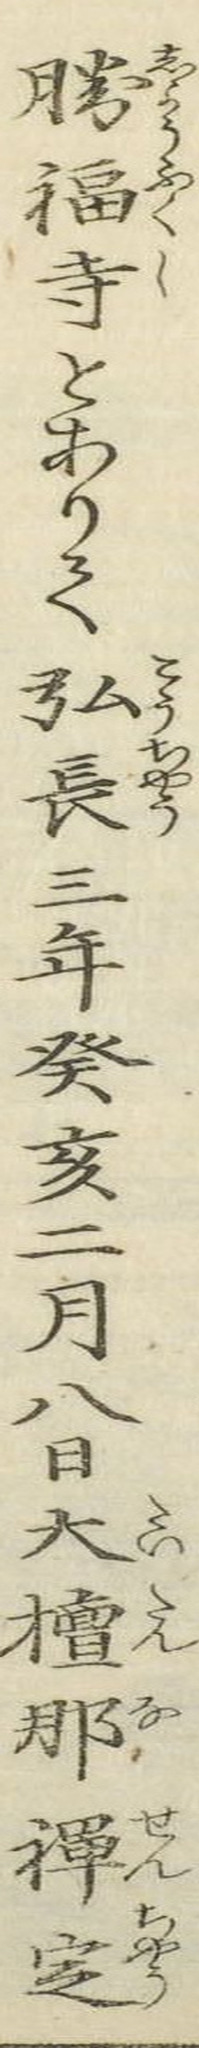勝福寺とありて弘長三年癸亥二月八日大檀那禅定
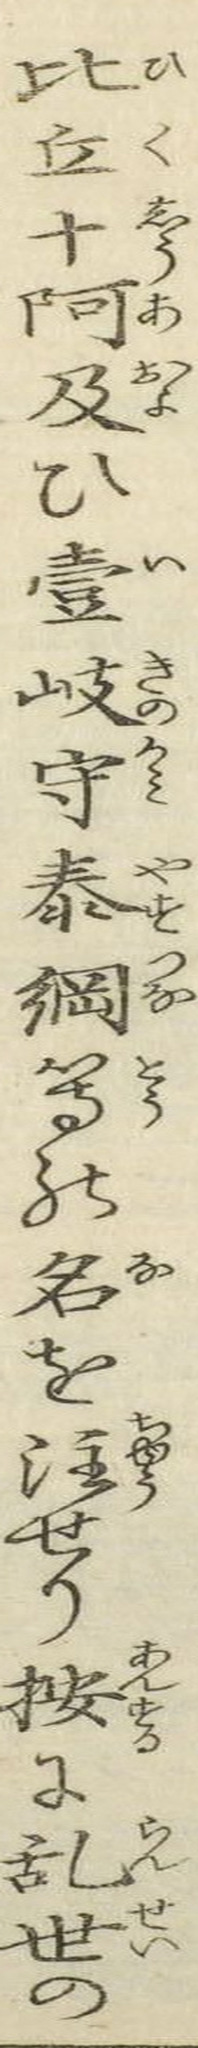比丘十阿及ひ壹岐守泰綱等の名を注せり按に乱世の
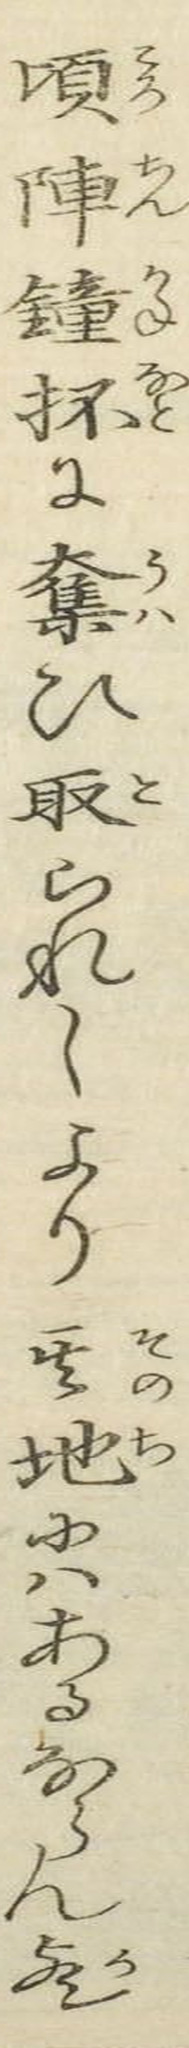頃陣鐘抔に奪ひ取られしより其地にはあるならん歟
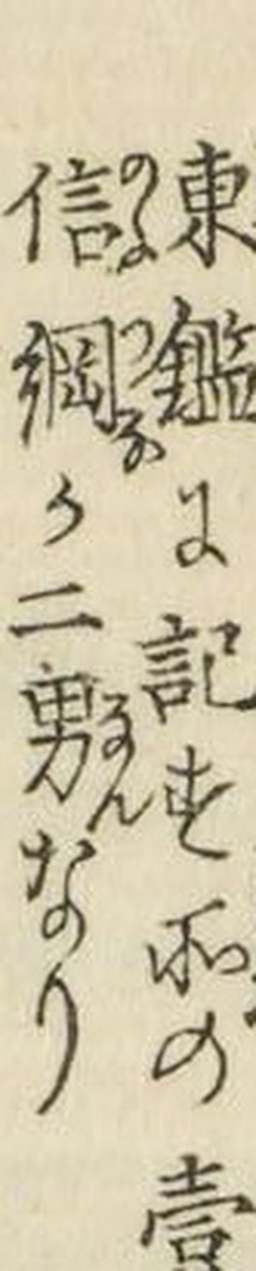信綱か二男なり
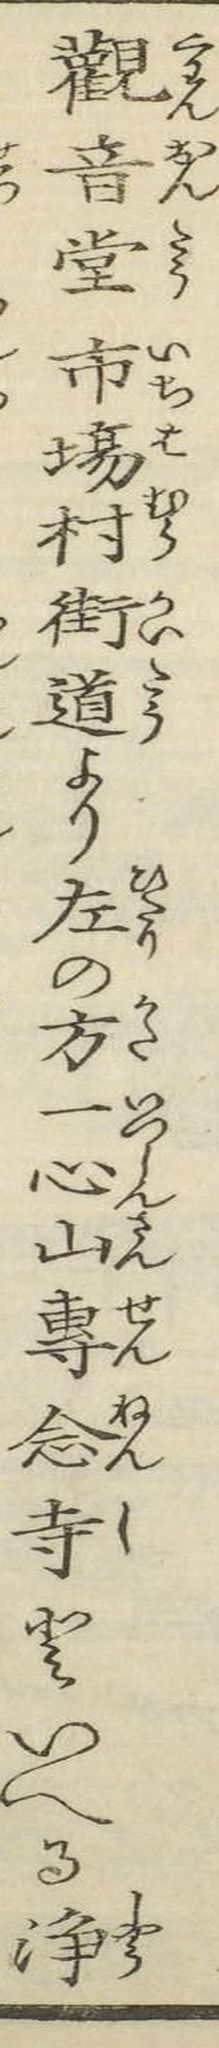観音堂市場村街道より左の方一心山専念寺といへる浄
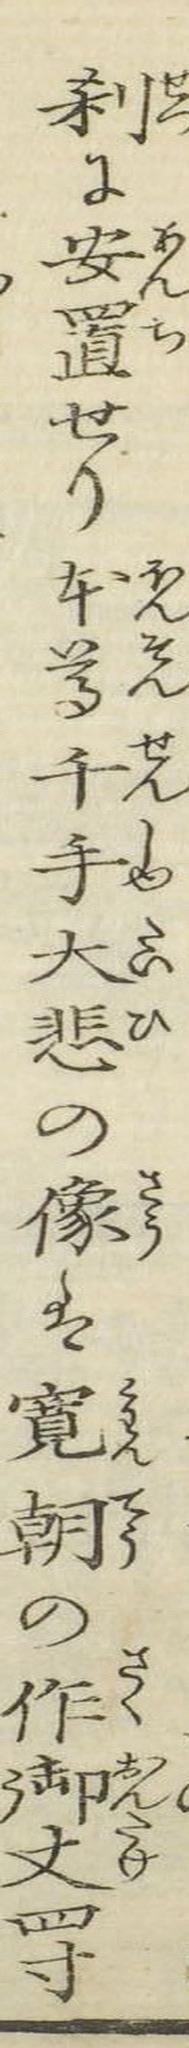刹に安置せり本尊千手大悲の像は寛朝の作御丈四寸
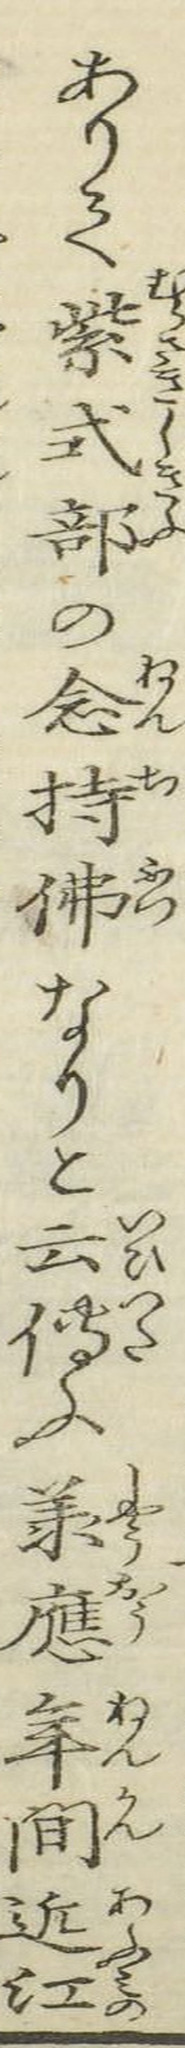ありて紫式部の念持佛なりと云傳ふ承應年間近江
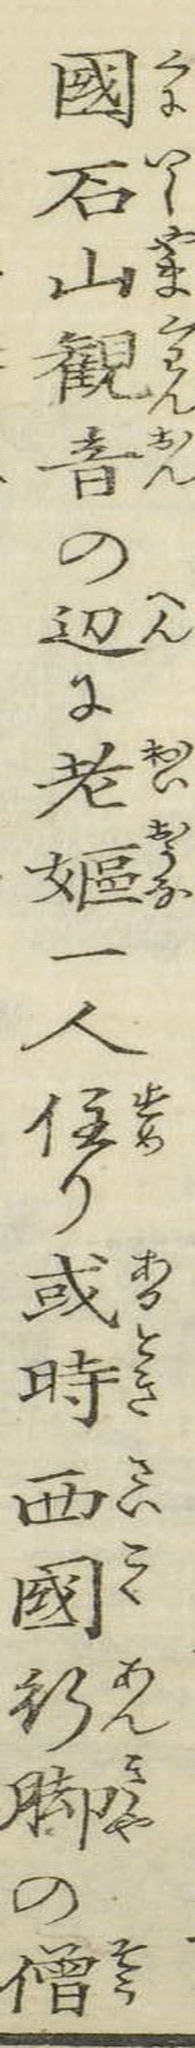國石山観音の辺に老嫗一人住り或時西國行脚の僧
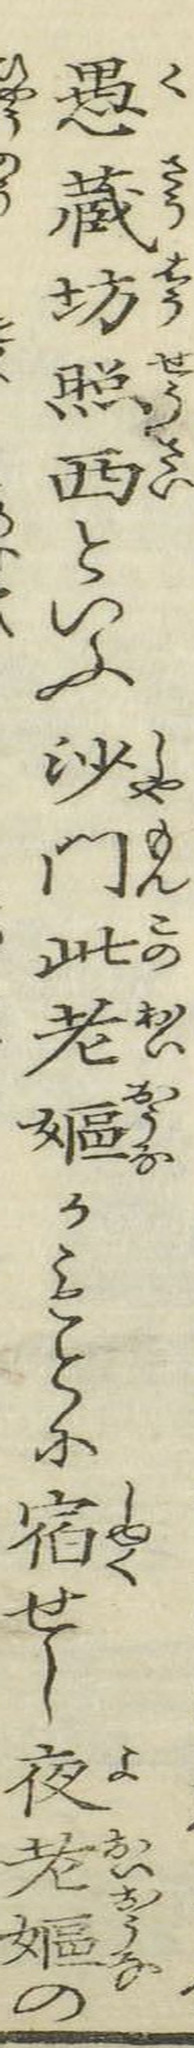愚蔵坊照西といふ沙門此老嫗かもとに宿せし夜老嫗の
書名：江戸名所図会 20巻 巻之5
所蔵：東京学芸大学教育コンテンツアーカイブ
